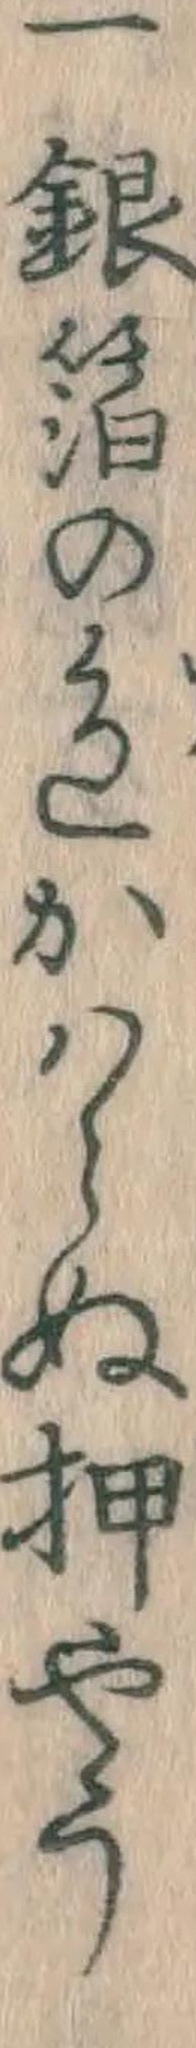一銀箔の色かはらぬ押やう
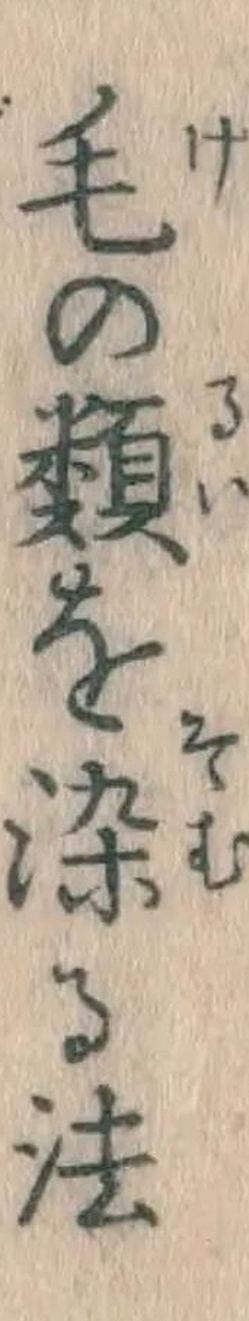一毛の類を染る法
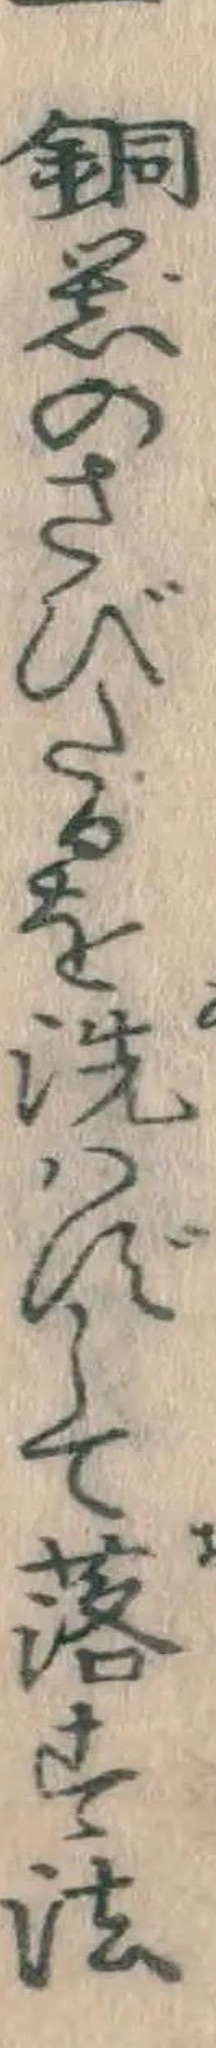一銅器のさびたるを洗はずして落す法
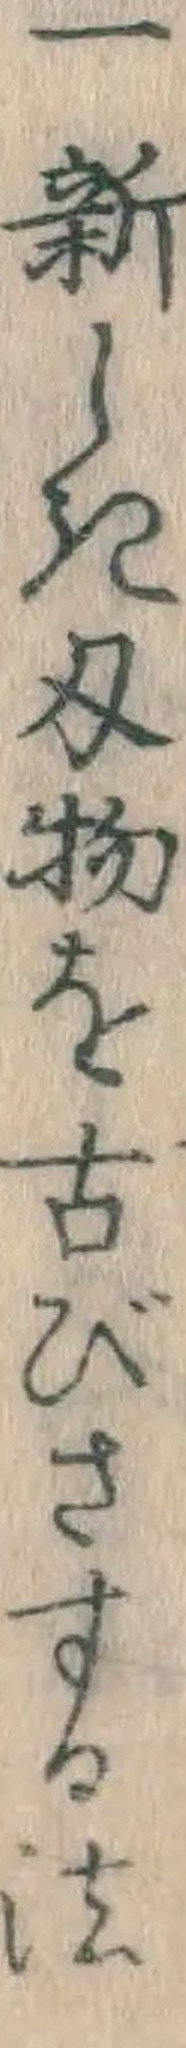一新しき刃物を古びさする法
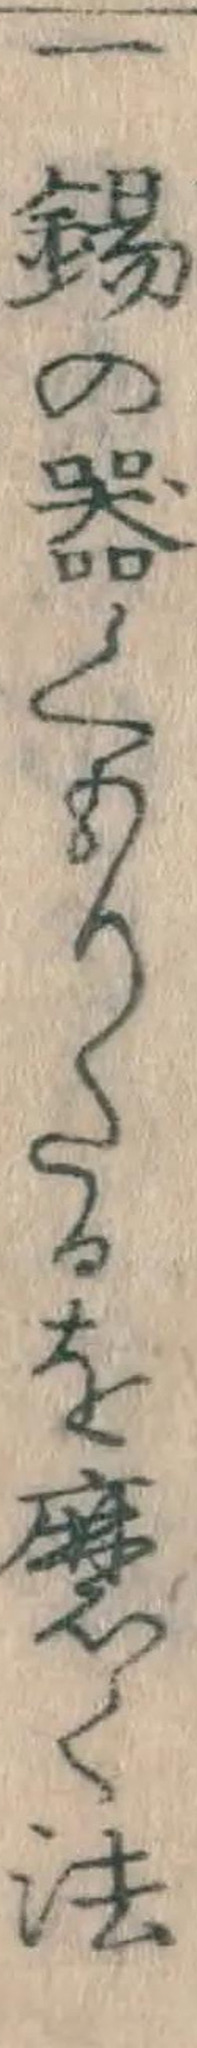一錫の器くもりたるを磨く法
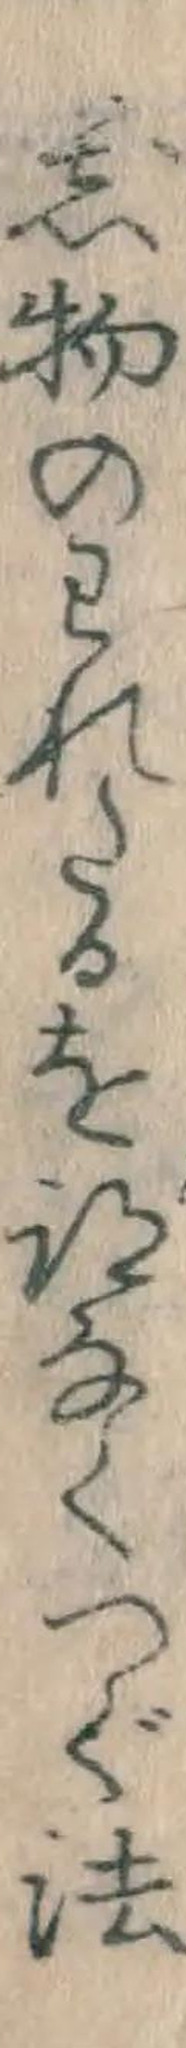一器物のわれたるを跡なくつぐ法
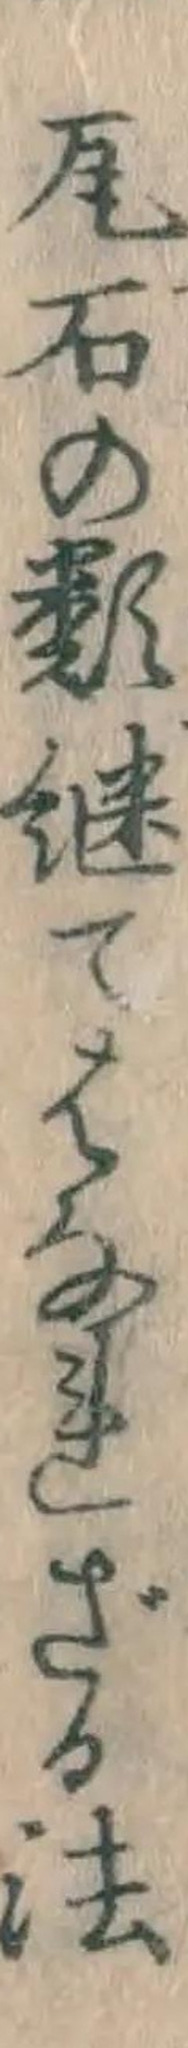一瓦石の類継てはなれざる法

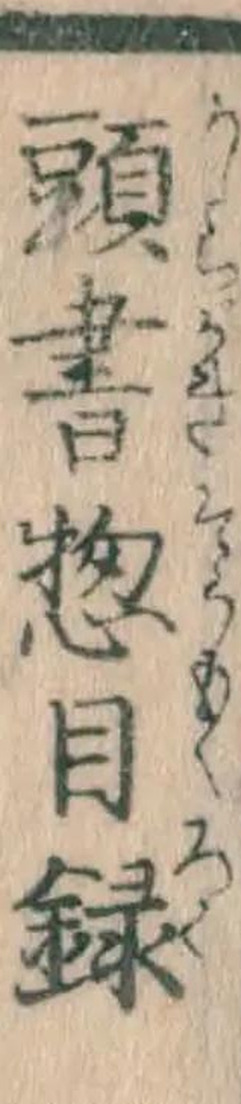頭書惣目録
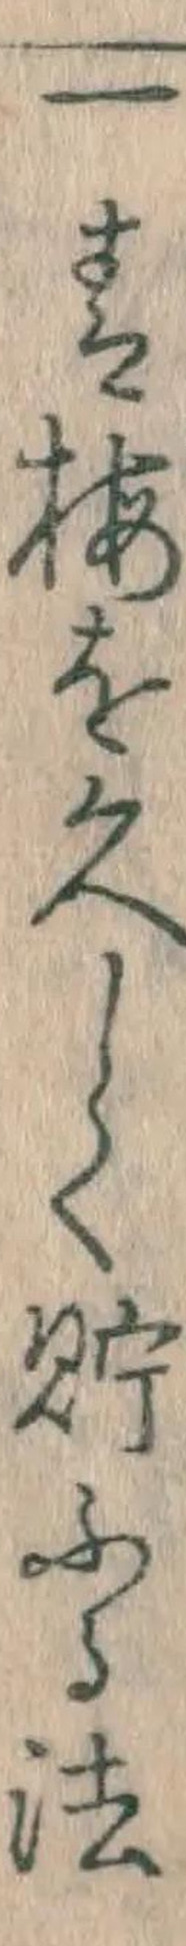一青梅を久しく貯ふる法
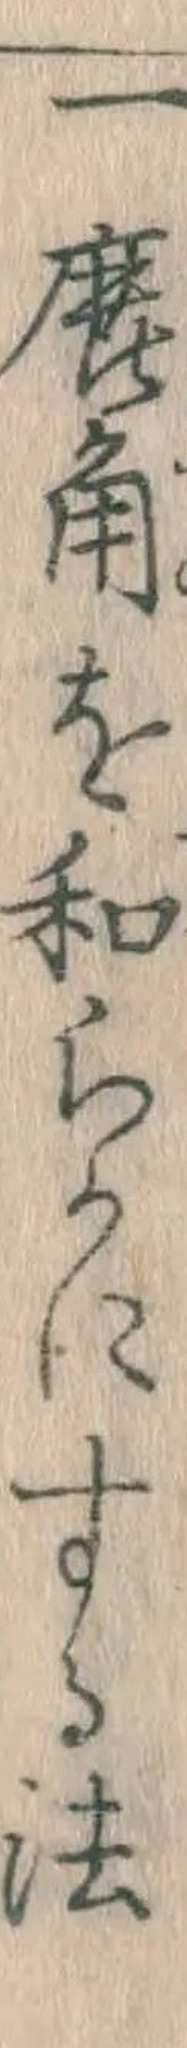一鹿角を和らかにする法
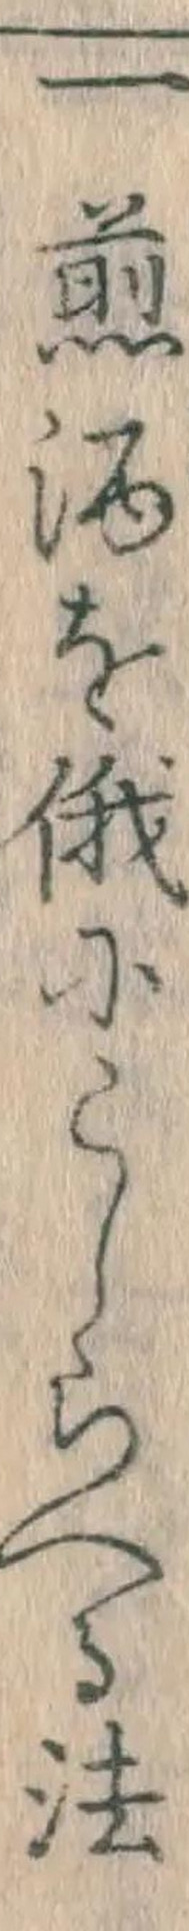一煎酒を俄にこしらへる法
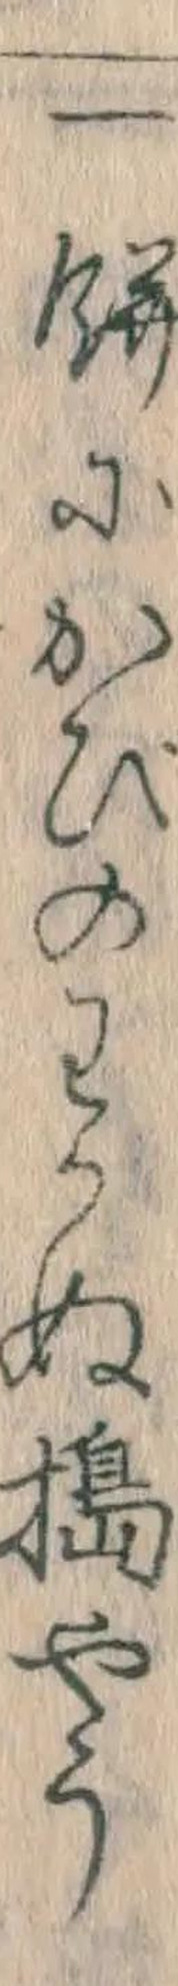一餅にかびのわかぬ搗やう
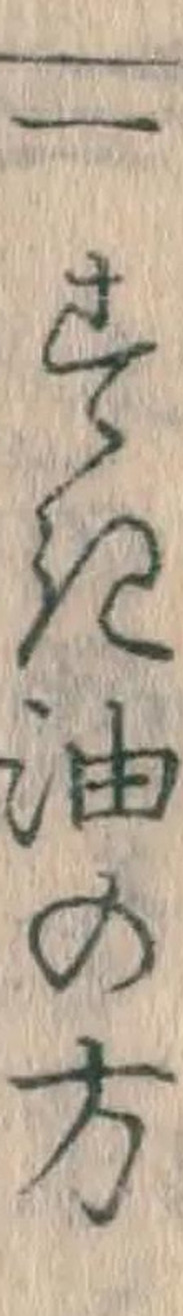一すき油の方
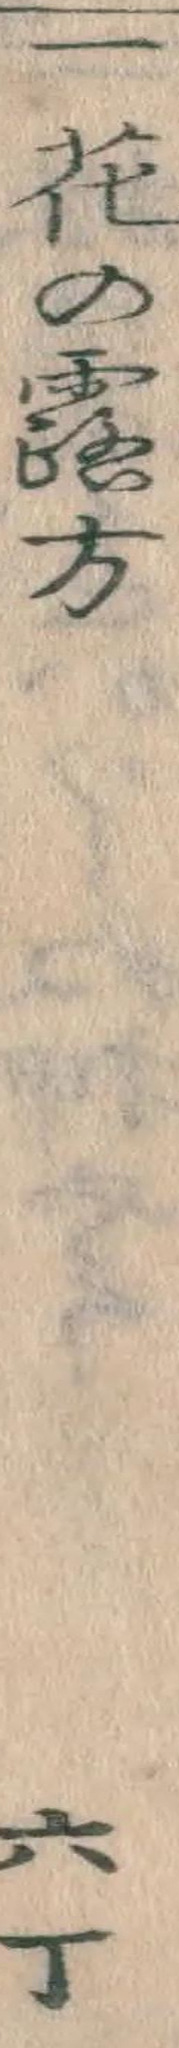一花の露方六丁
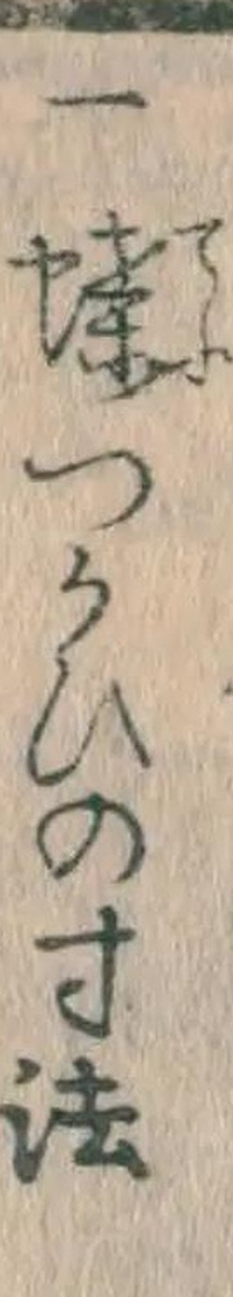一蝶つかひの寸法
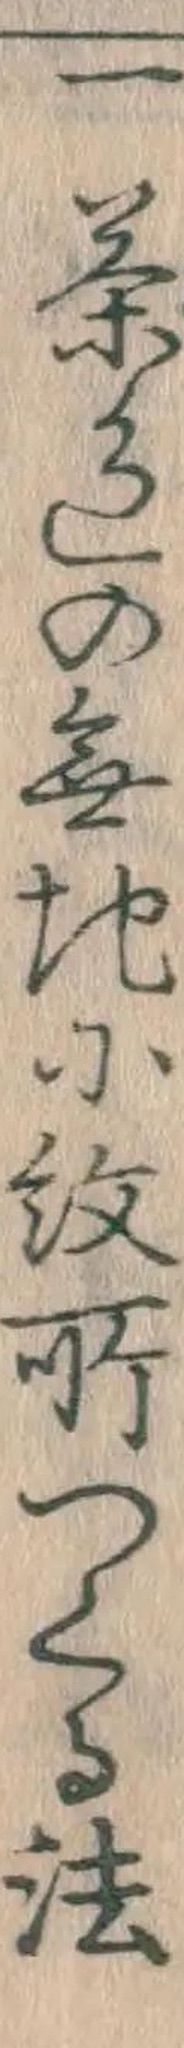一茶色の無地に紋所つくる法
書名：広益秘事大全 3巻. [1]
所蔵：国立国会図書館 National Diet Library, JAPAN
